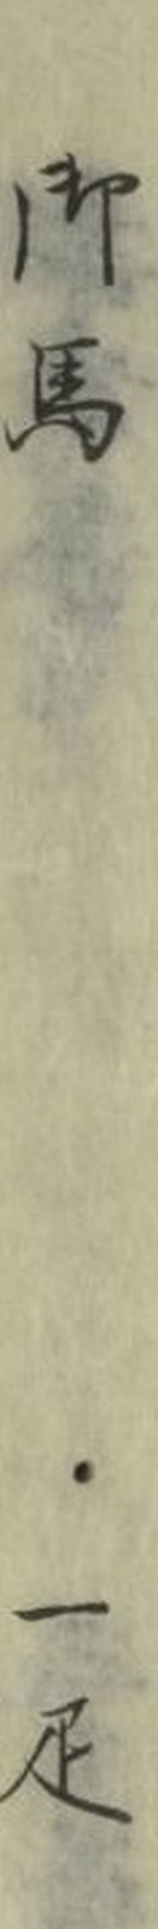御馬一疋
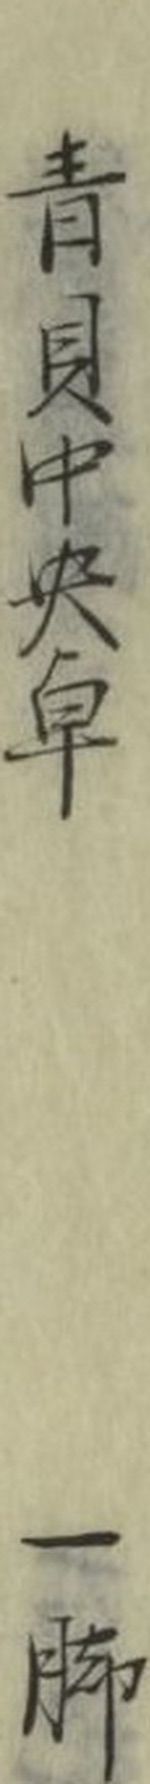青貝中央卓一脚
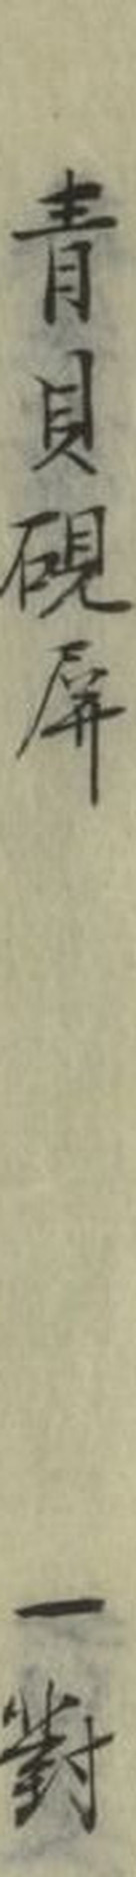青貝硯屏一対

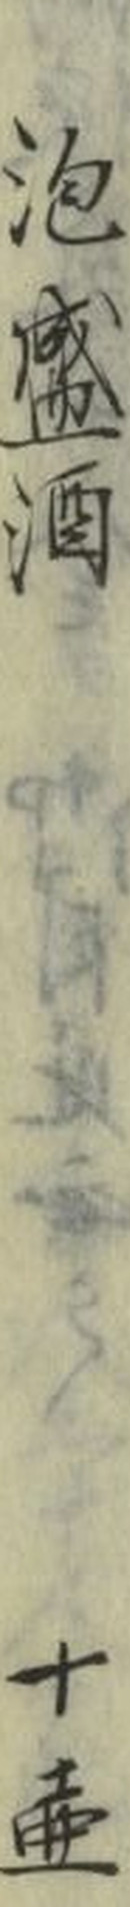泡盛酒十壺
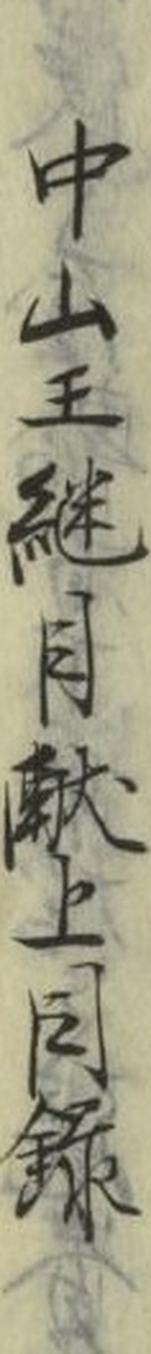中山王継目献上目録
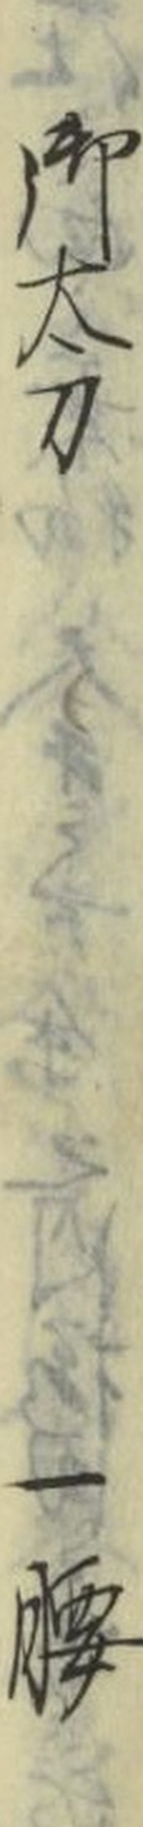御太刀一腰
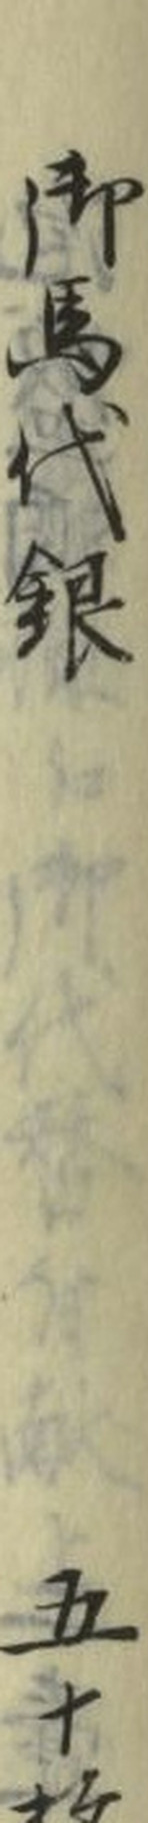御馬代銀五十枚
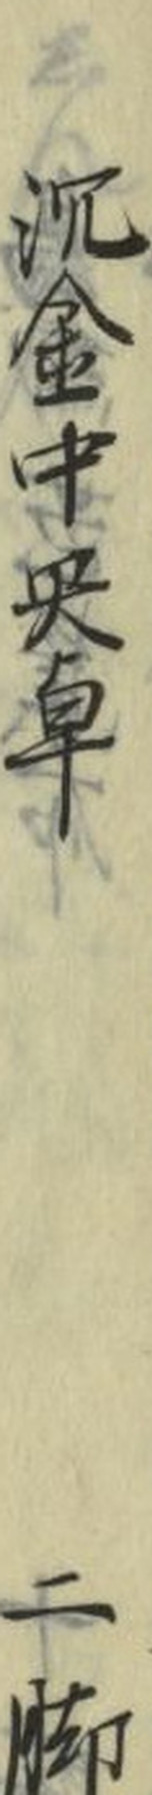沉金中央卓二脚
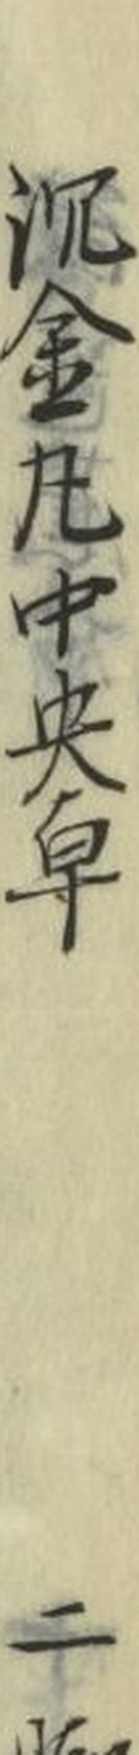沉金丸中央卓二脚
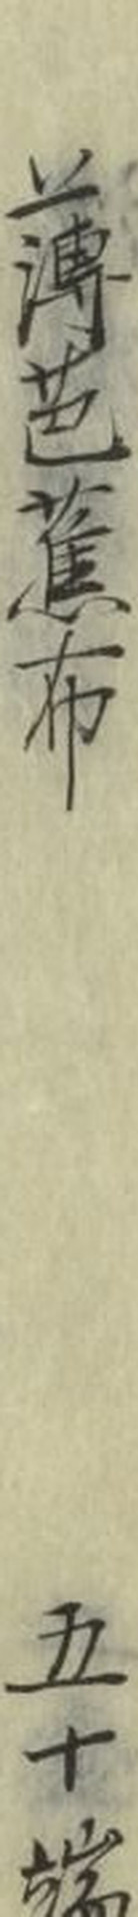薄芭蕉布五十端
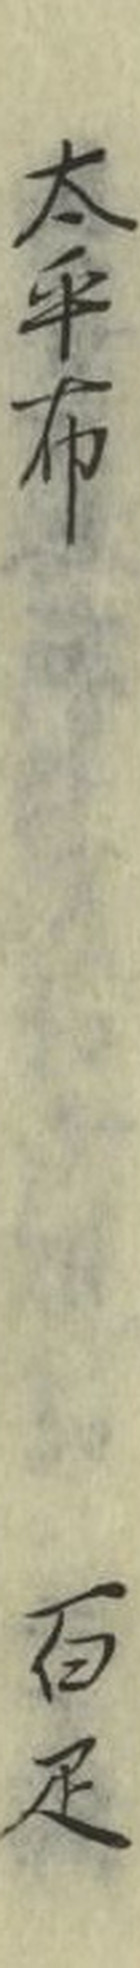太平布百疋
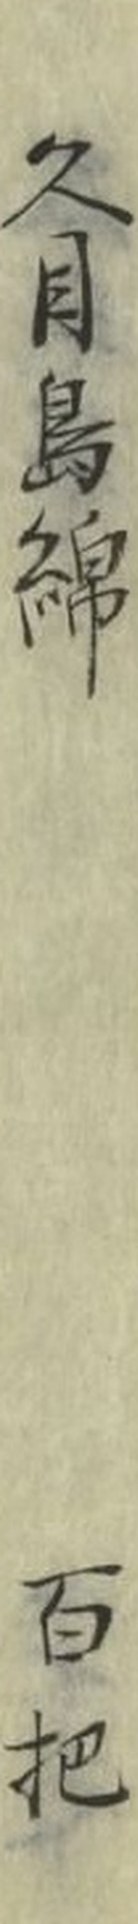久目島綿百把
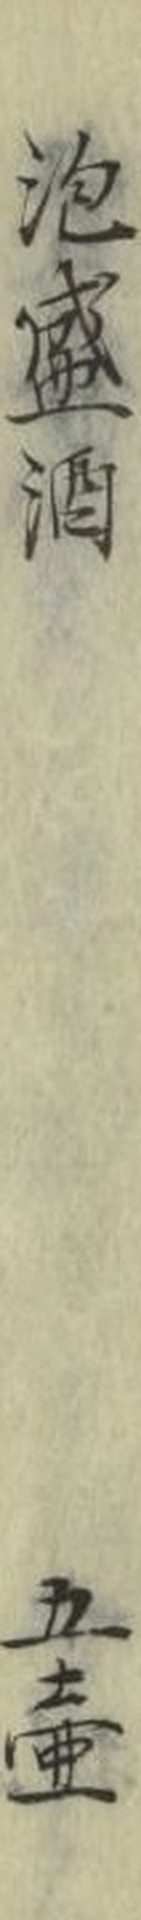泡盛酒五壺
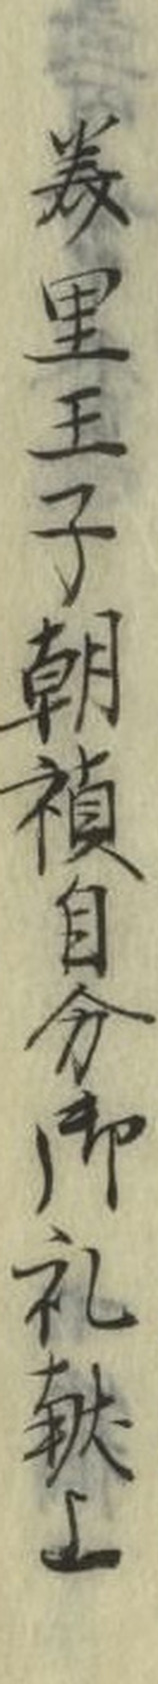美里王子朝禎自分御礼献上

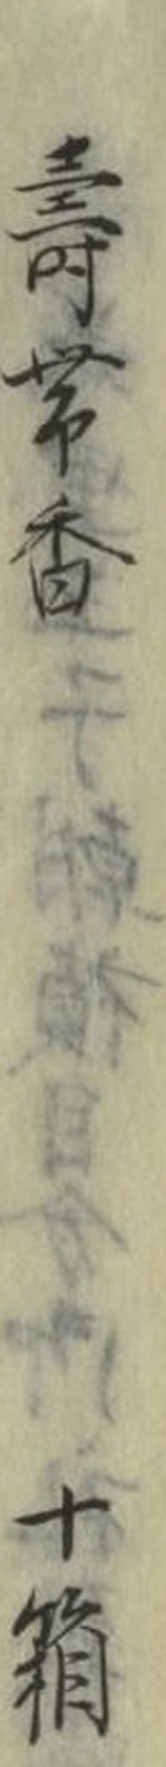寿帯香十箱
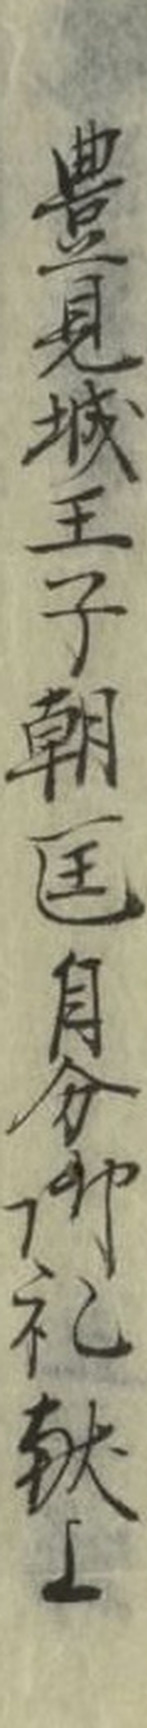豊見城王子朝匡自分御礼献上
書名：宝永七庚寅年琉球国来聘使日記
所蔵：University of the Ryukyus Library
